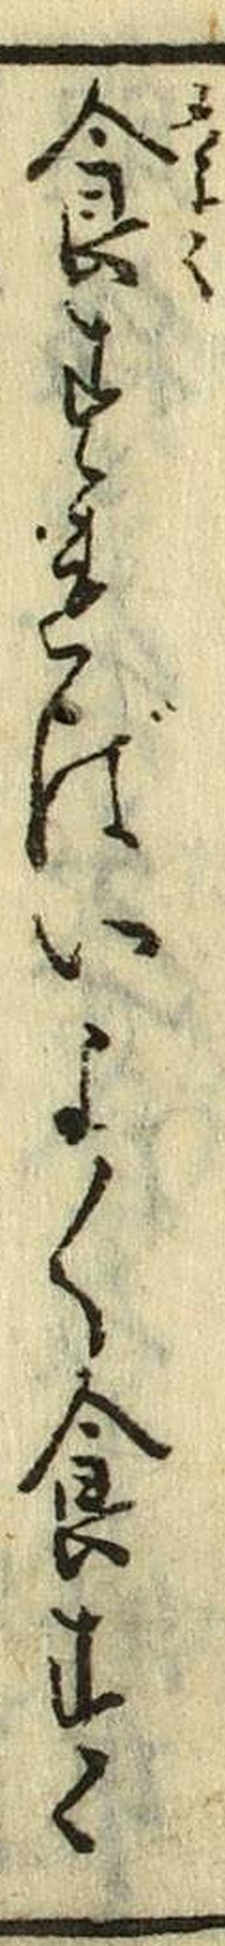食すればいよ〳〵食すゝ
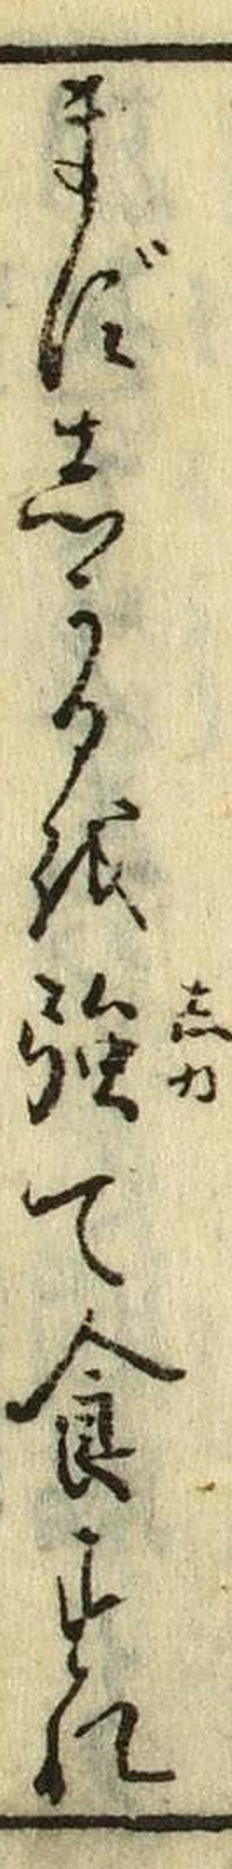まずしかるを強て食すれ
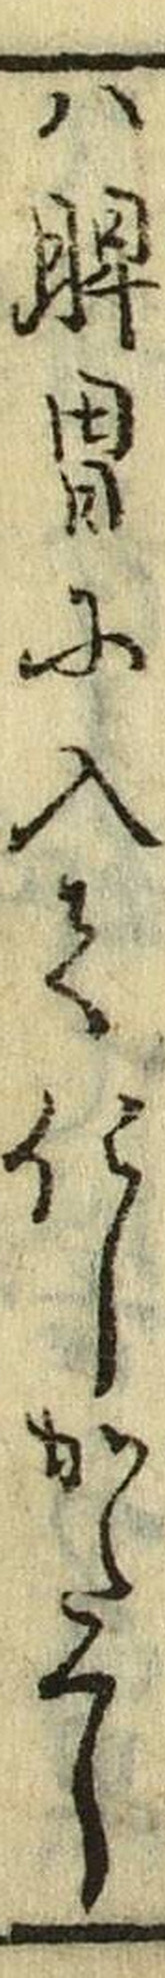は脾胃に入て化しがたくし

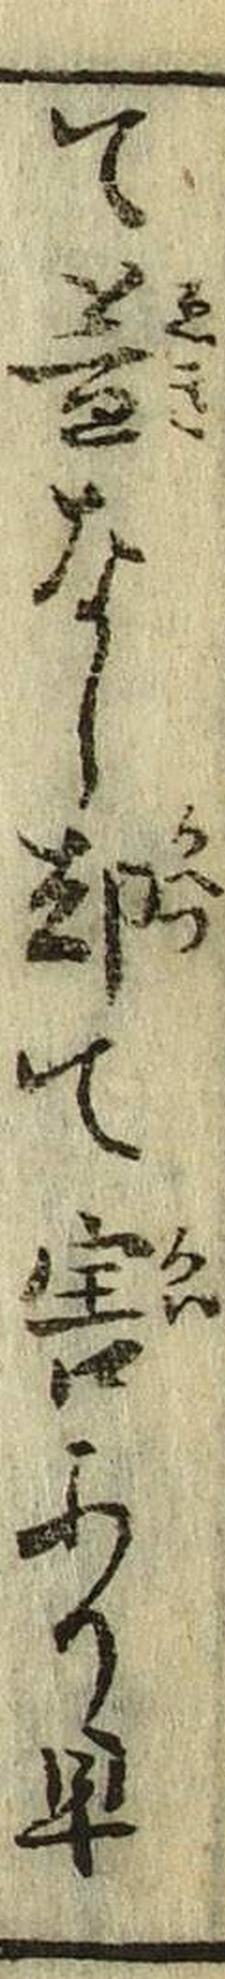て益なし却て害あり早
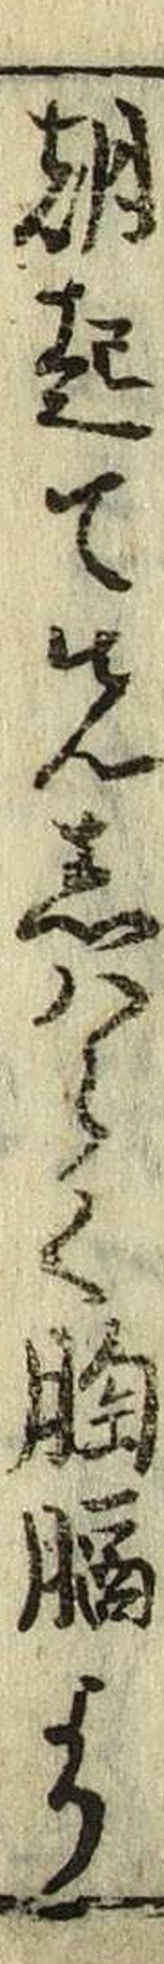朝起て先しばらく胸膈より
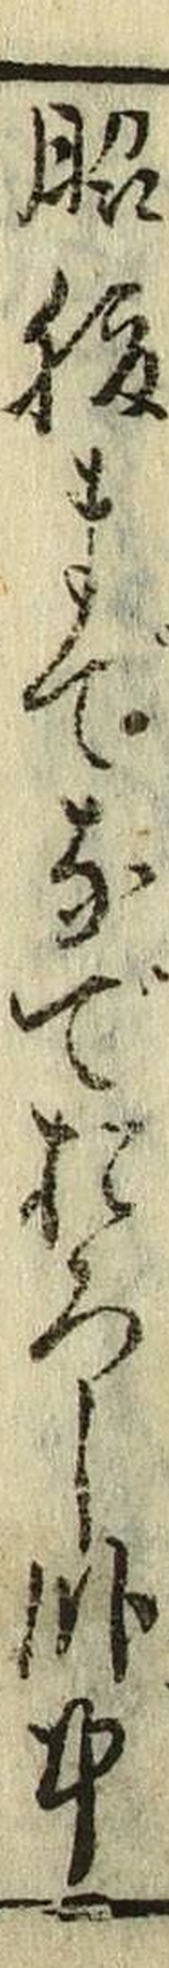脇腹までなでおろし臥中
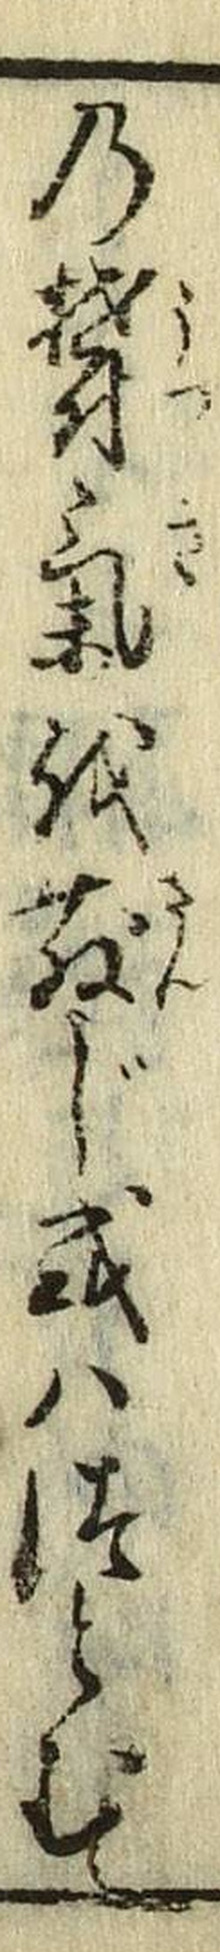の鬱気を散じ或はつとむ
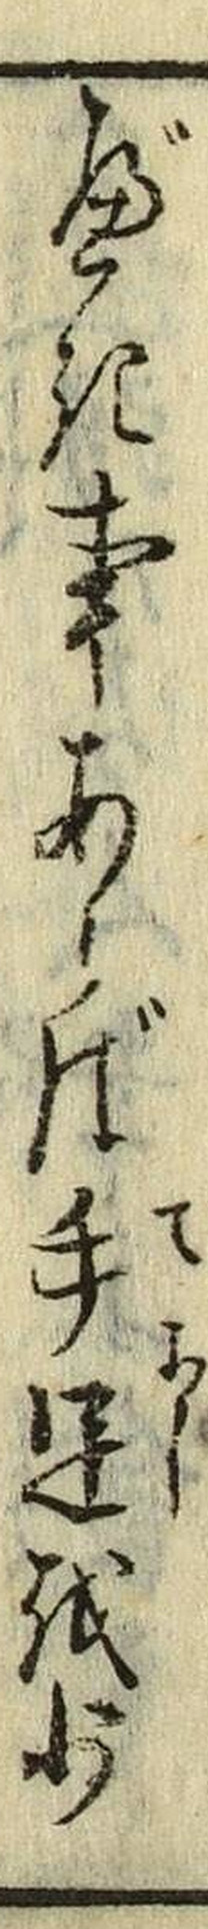べき事あらば手足を少
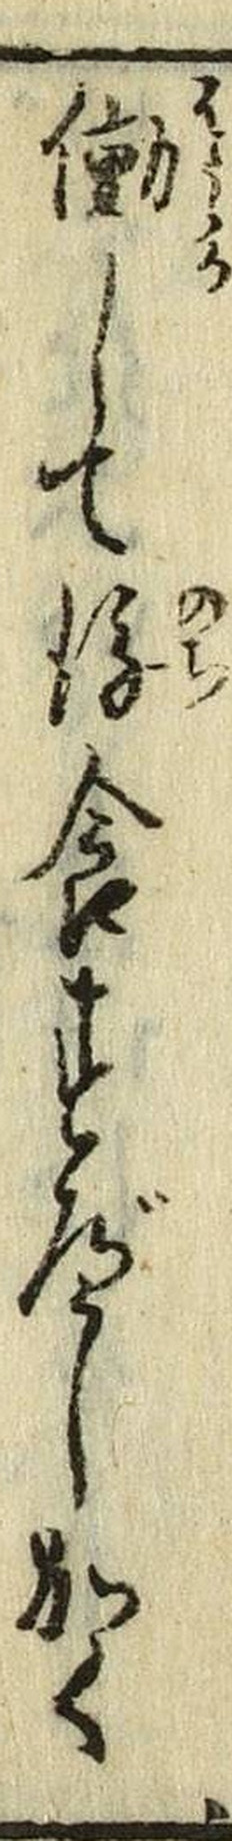働して後食すべしかく
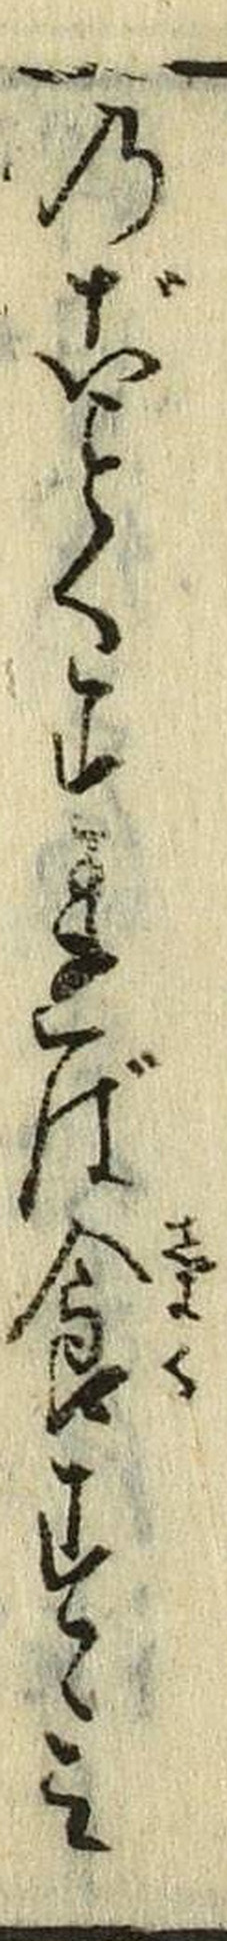のごとくすれば食すゝみ
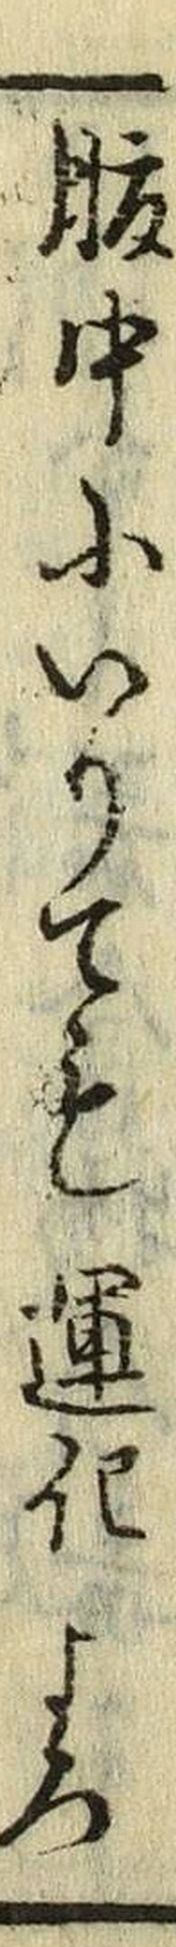腹中にいりても運化よろ
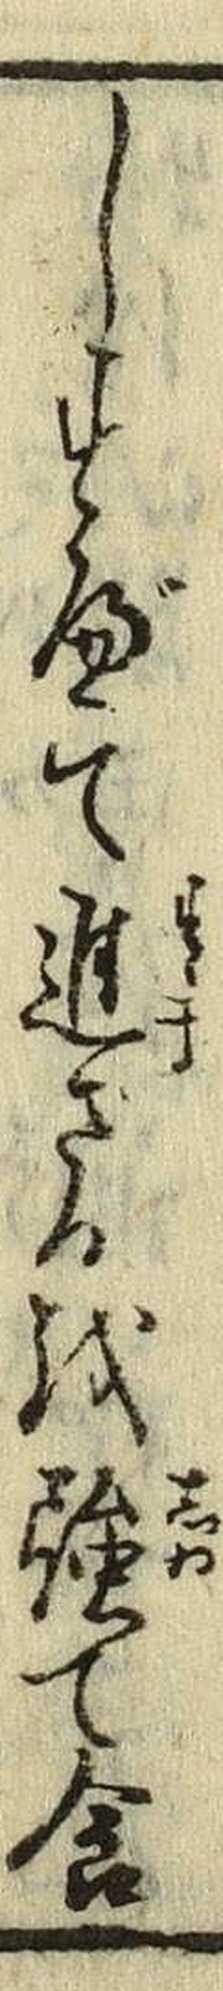しすべて進ざるを強て食
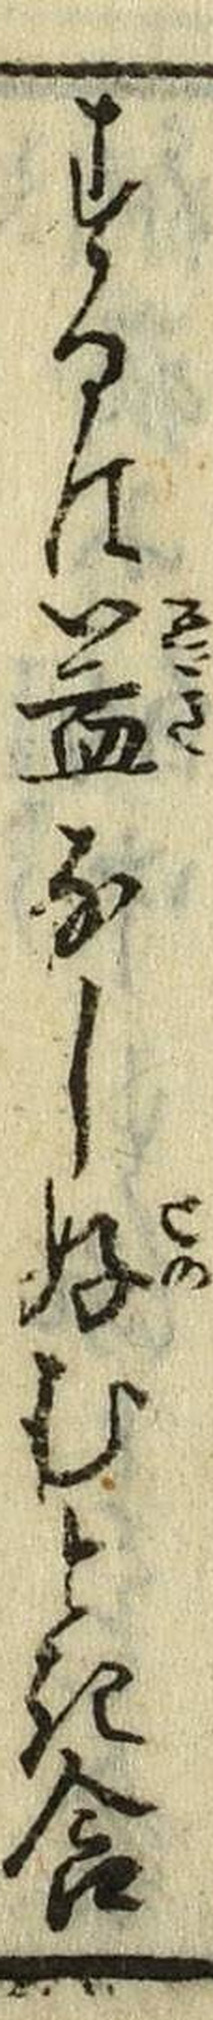するは益なし好むとき食
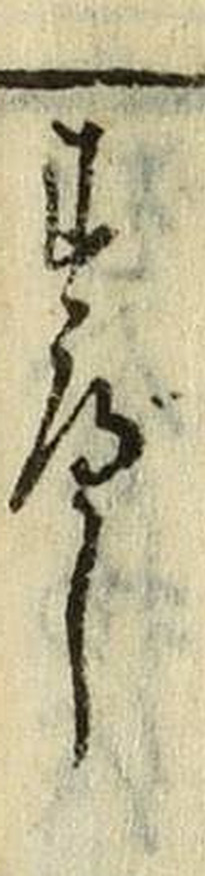すべし
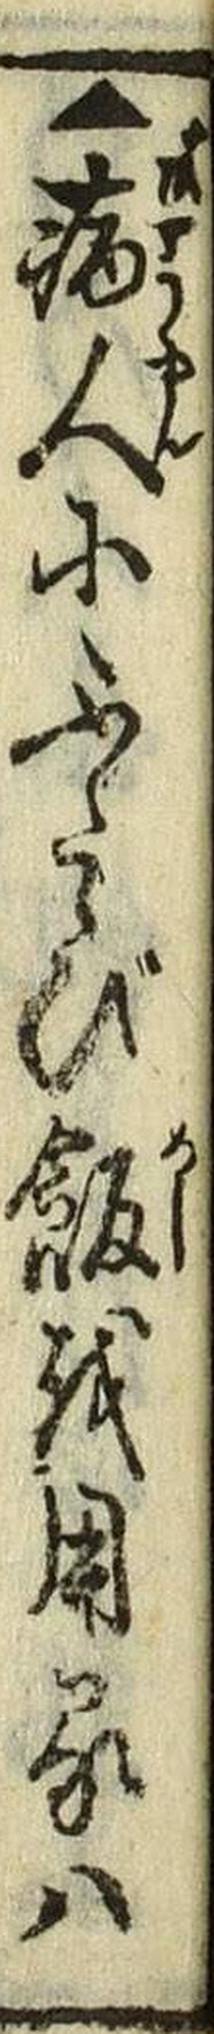▲病人にふたゝび飯を用るは
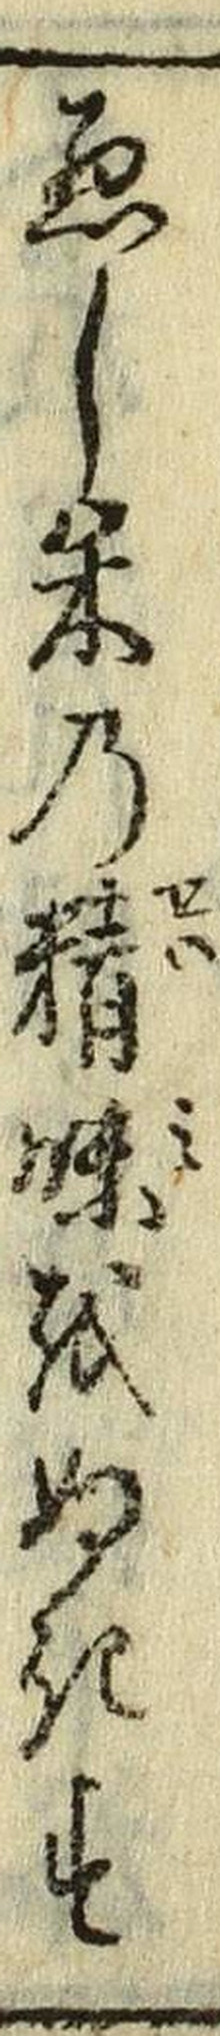悪し米の精味をぬきす
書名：居家養生記
